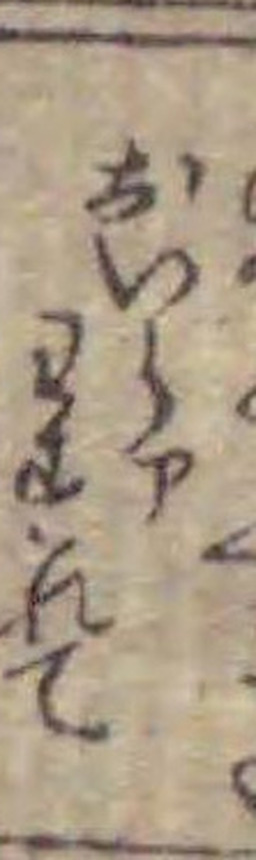わすれて
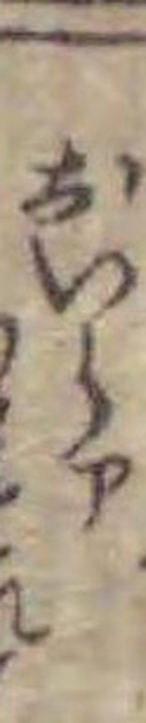おいらア
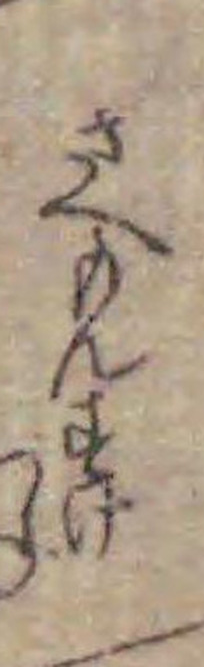さへもんすけ
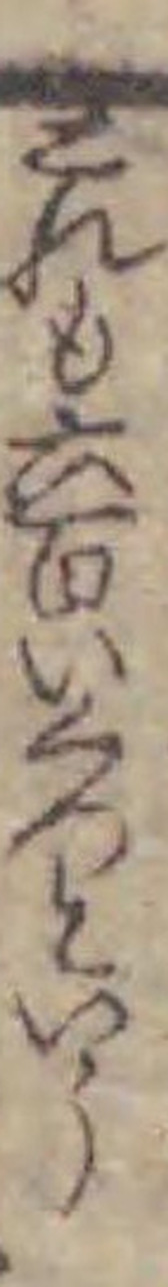これも六百いくつという
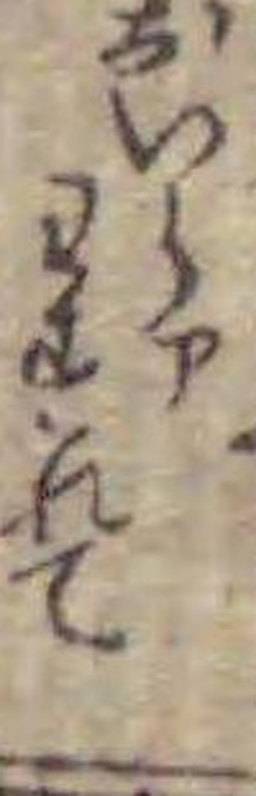わすれて
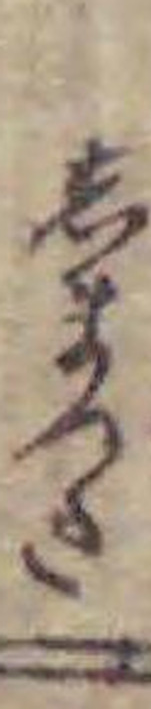しまつた
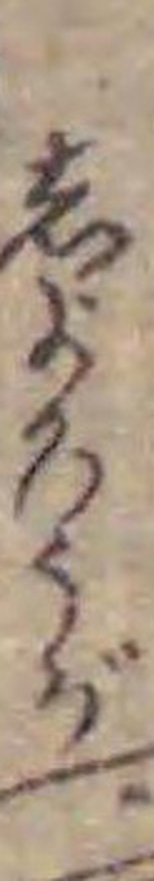しよろうが
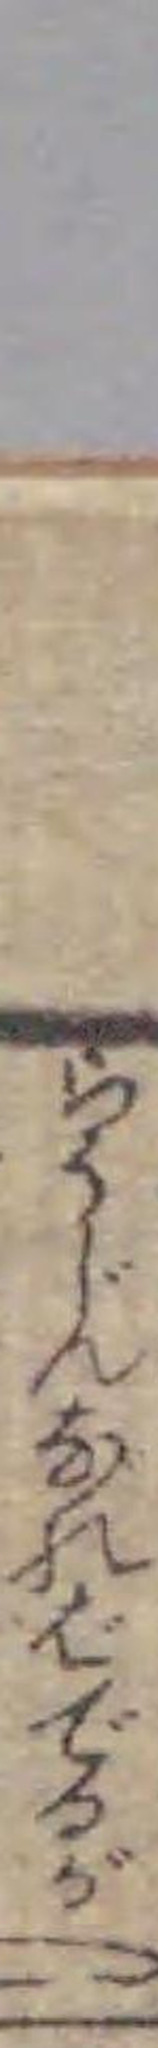らうじんなればでるが
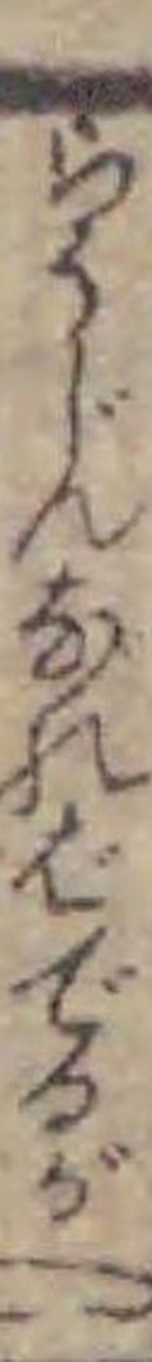らうじんなればでるが
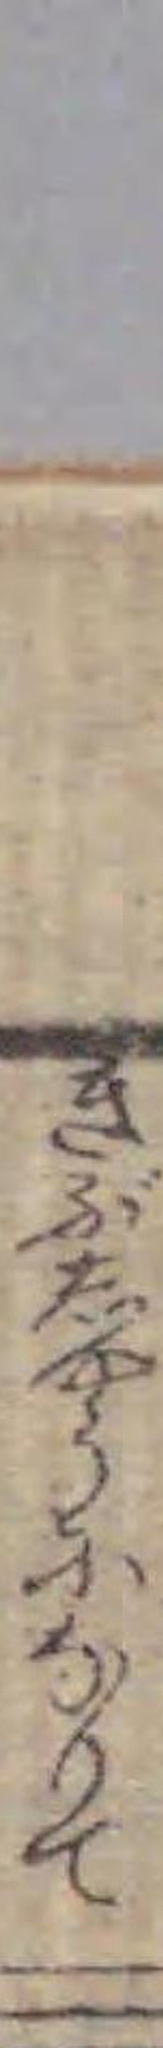きぶしやうになりて
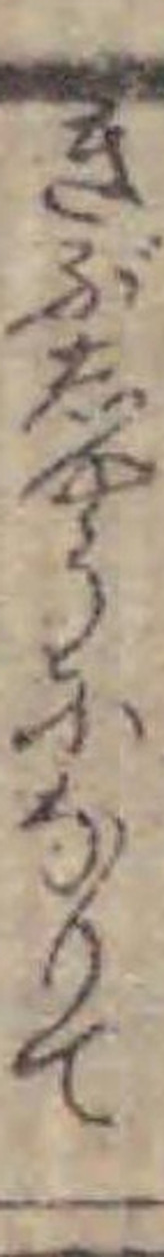きぶしやうになりて
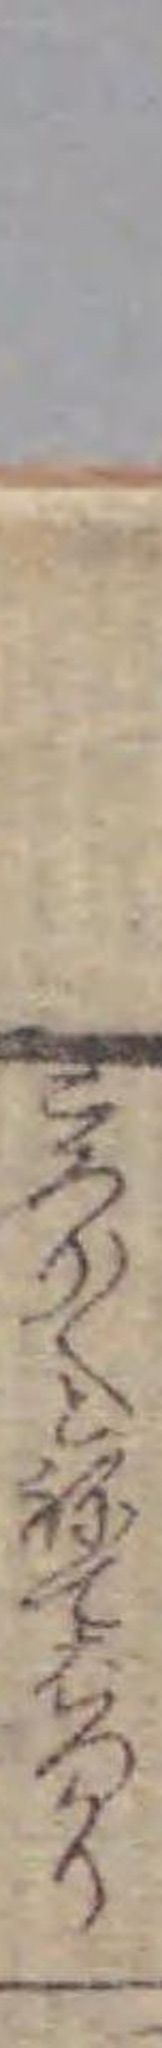ころり〳〵とねてばつかり
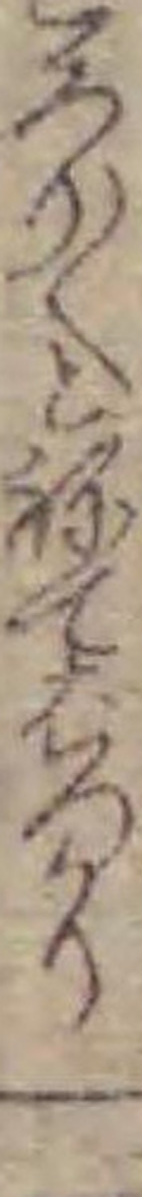ころり〳〵とねてばつかり
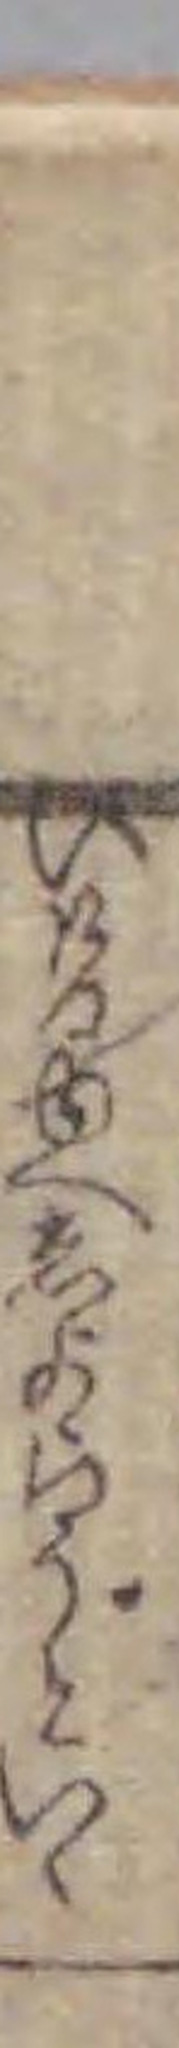いけるゆへしよらうといゝ
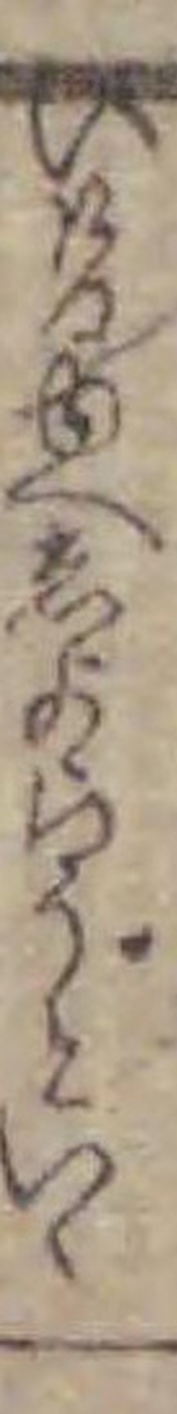いけるゆへしよらうといゝ
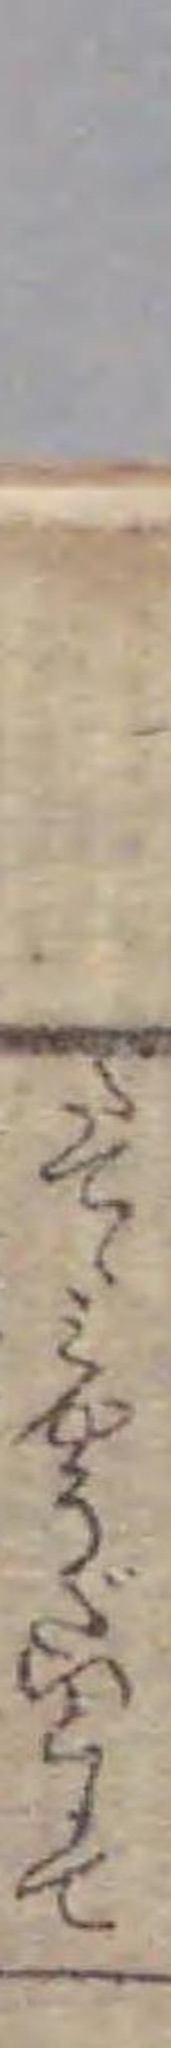たてゝみやうだいとして
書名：年寄之冷水曽我 : 3巻
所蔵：国立国会図書館 National Diet Library, JAPAN
